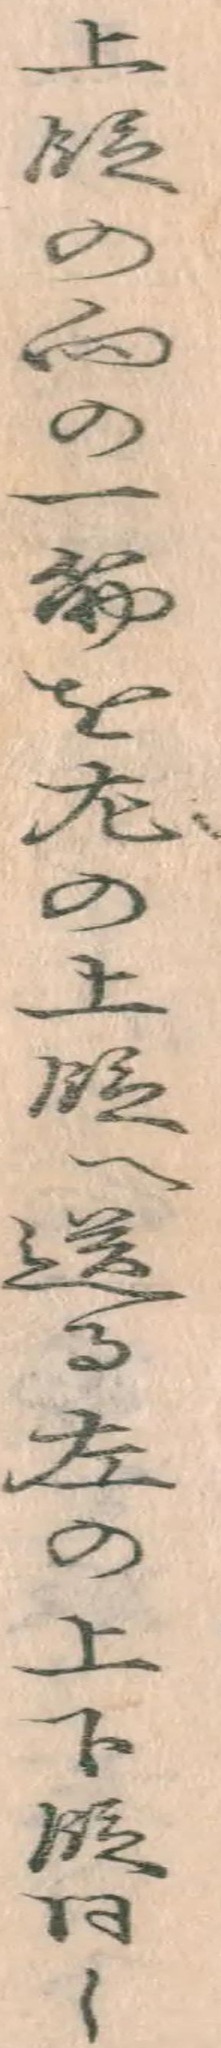上段の向の一筋を左の上段へ送る左の上下段同し
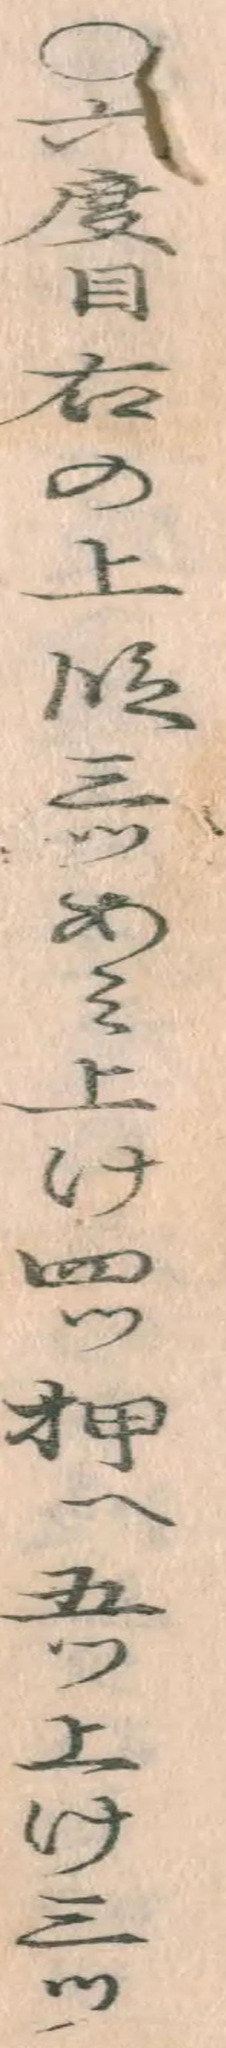○六度目右の上段三ッあみ上け四ッ押へ五ッ上け三ッ
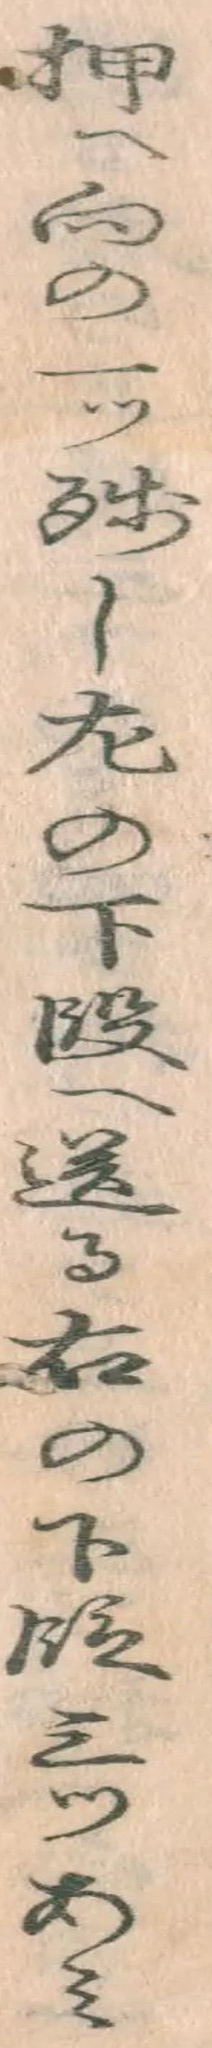押へ向の一ッ残し左の下段へ送る右の下段三ッあみ
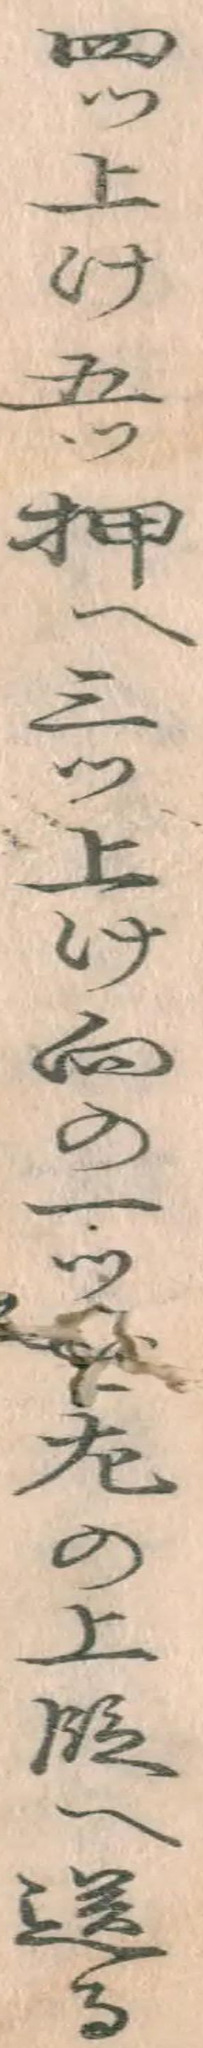四ッ上け五ッ押へ三ッ上け向の一ッを左の上段へ送る
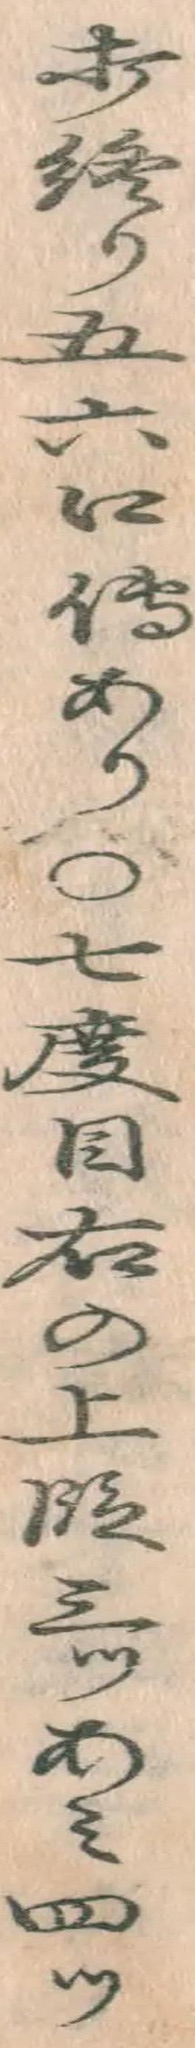打終り五六口伝あり○七度目右の上段三ッあみ四ッ
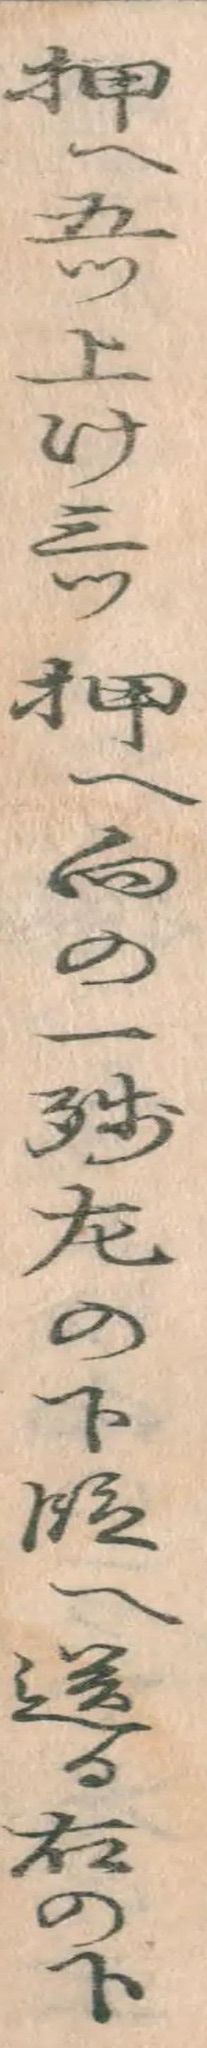押へ五ッ上け三ッ押へ向の一残左の下段へ送る右の下

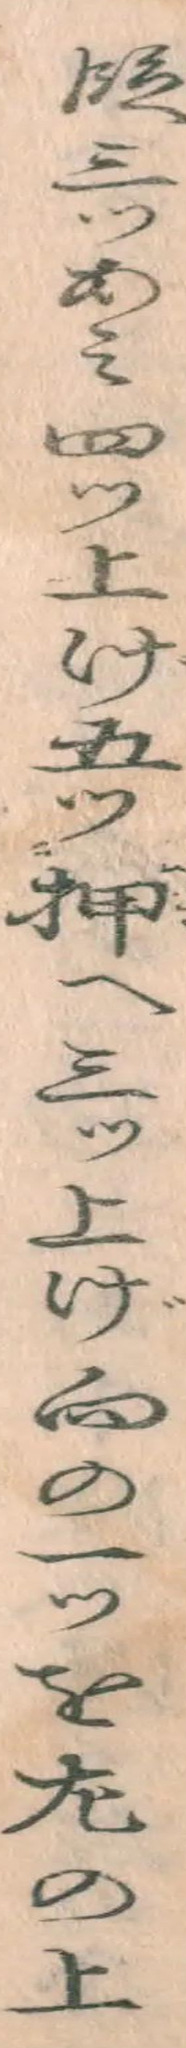段三ッあみ四ッ上げ五ッ押へ三ッ上げ向の一ッを左の上
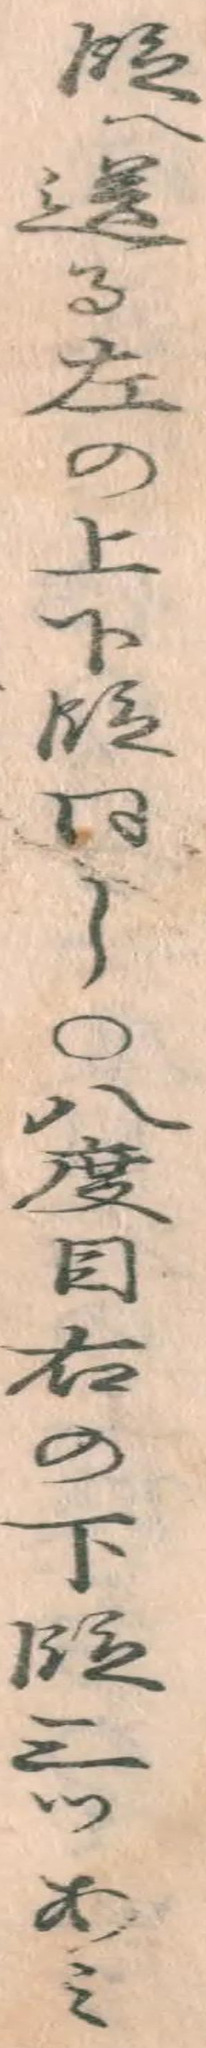段へ送る左の上下段同し○八度目右の下段三ッあみ
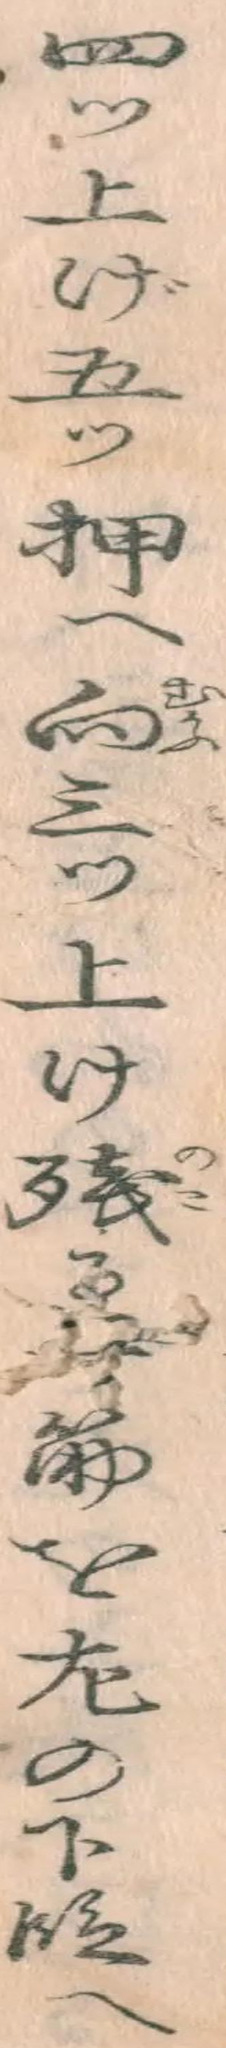四ッ上げ五ッ押へ向三ッ上け残る一筋を左の下段へ
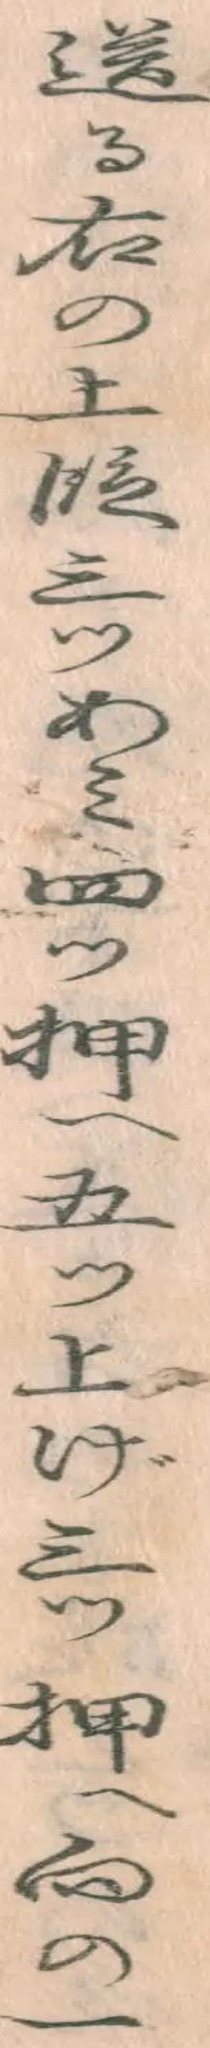送る右の上段三ッあみ四ッ押へ五ッ上げ三ッ押へ向の一
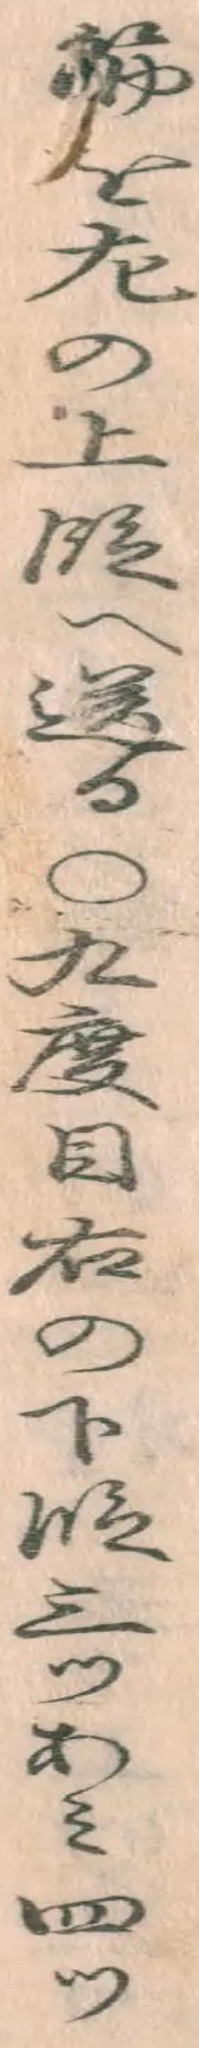筋を左の上段へ送る○九度目右の下段三ッあみ四ッ
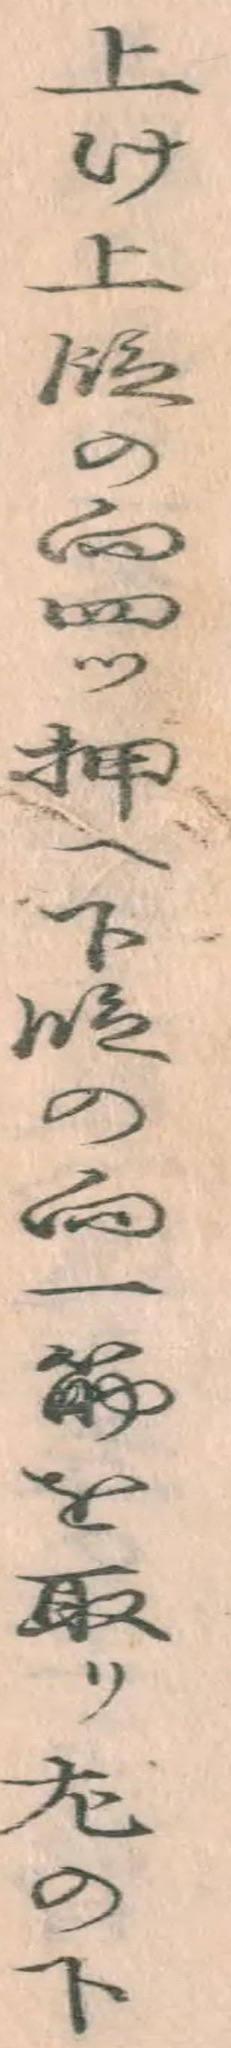上け上段の向四ッ押へ下段の向一筋を取り左の下
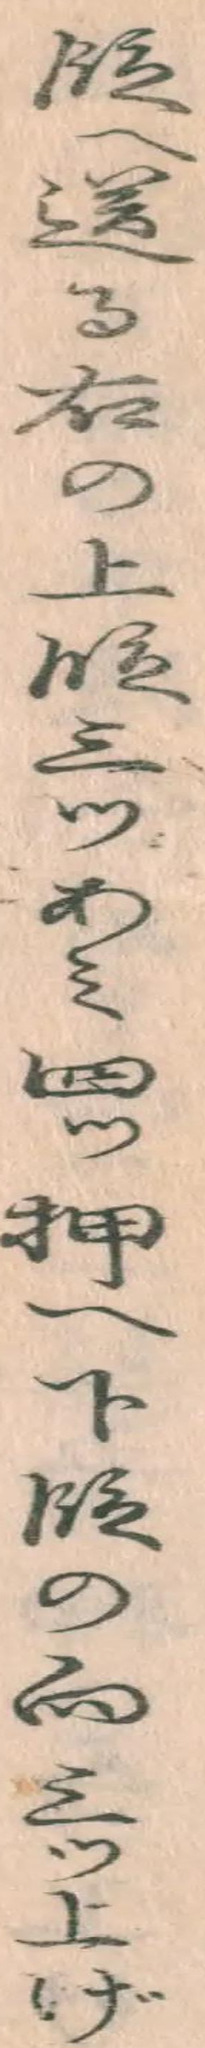段へ送る右の上段三ッあみ四ッ押へ下段の向三ッ上げ
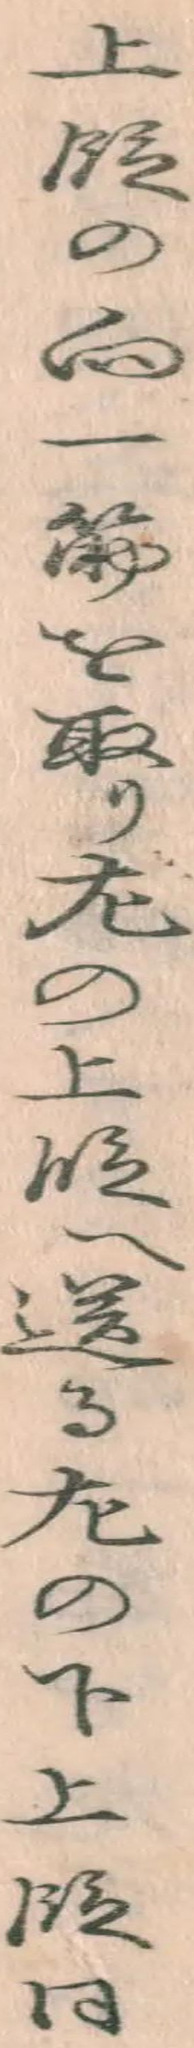上段の向一筋を取り左の上段へ送る左の下上段同
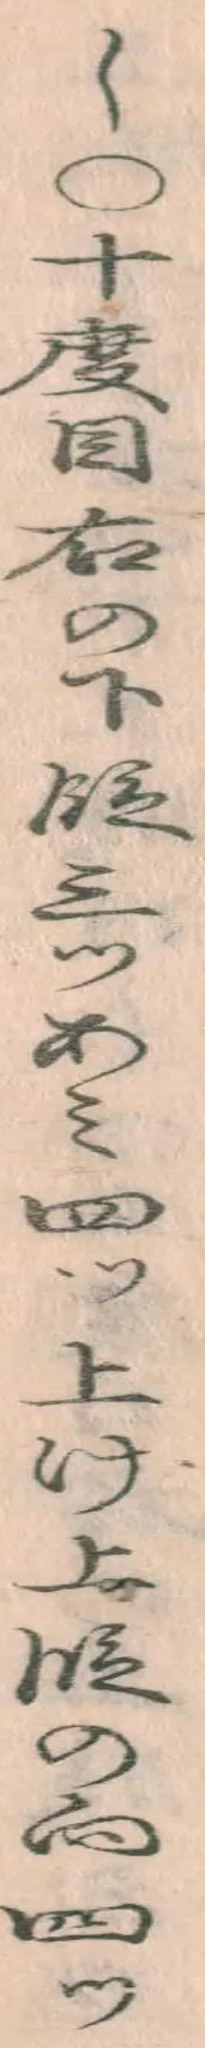し○十度目右の下段三ッあみ四ッ上け上段の向四ッ
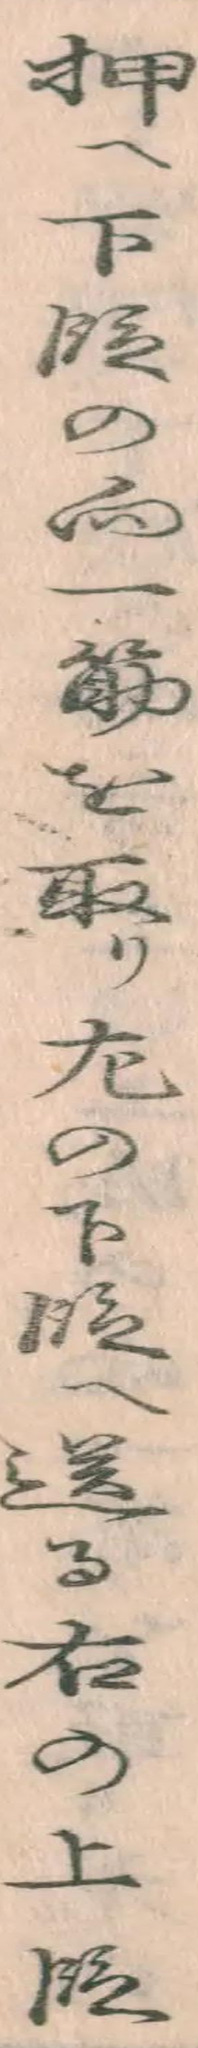押へ下段の向一筋を取り左の下段へ送る右の上段
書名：機織彙編 5巻. [2]
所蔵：国立国会図書館 National Diet Library, JAPAN
